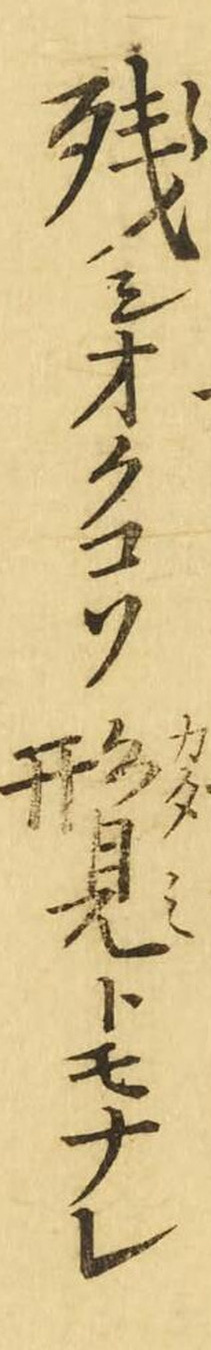残シオクコソ形見トモナレ
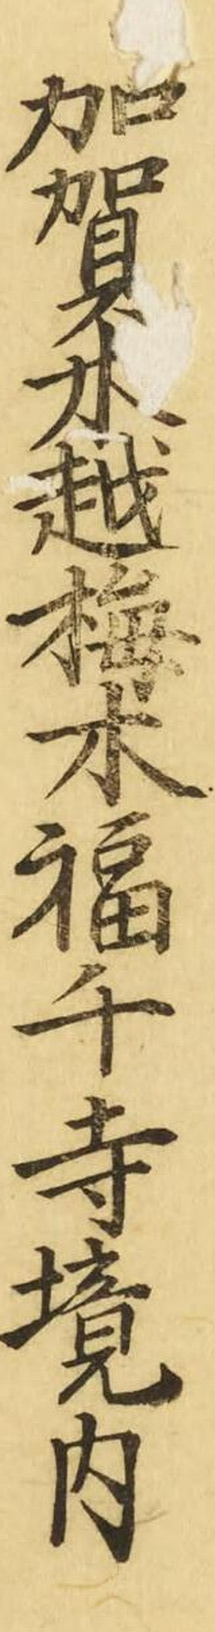加賀木越梅木福千寺境内

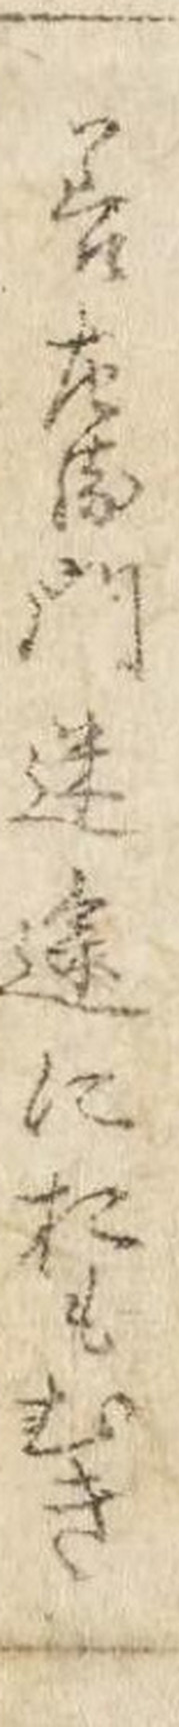善左衛門迷途におもむき
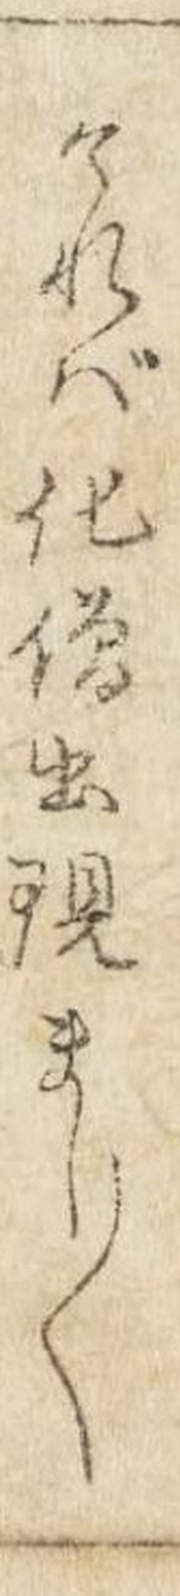ければ化僧出現まし〳〵
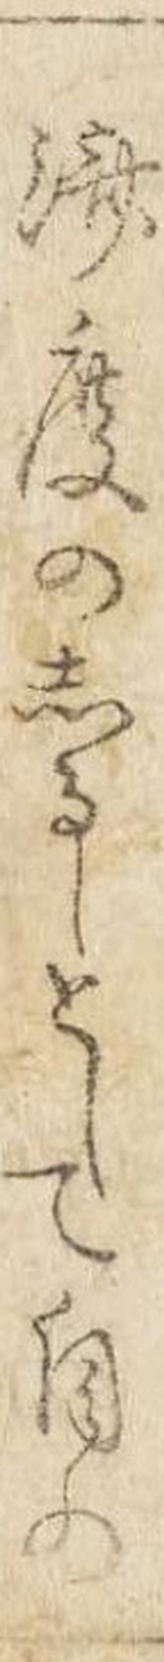済度のしるしとして自の
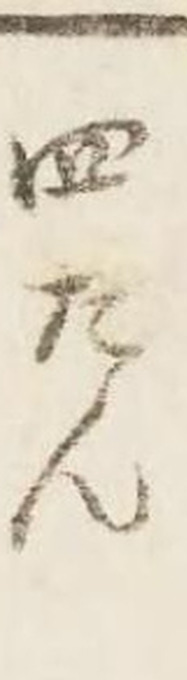四たん
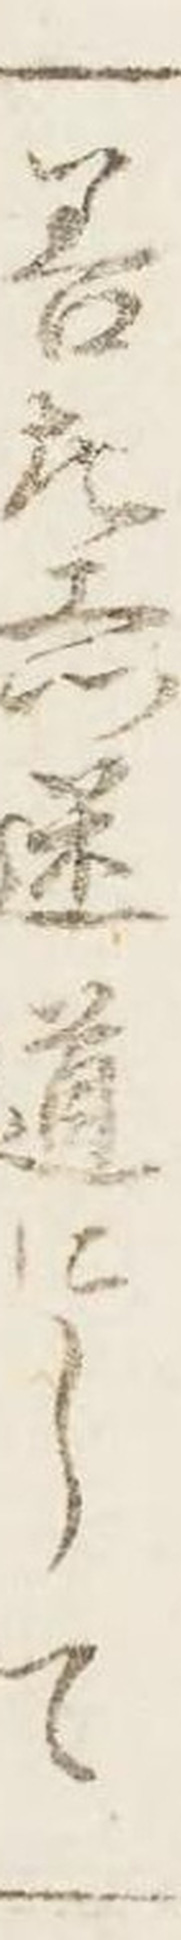善左衛門迷道にして
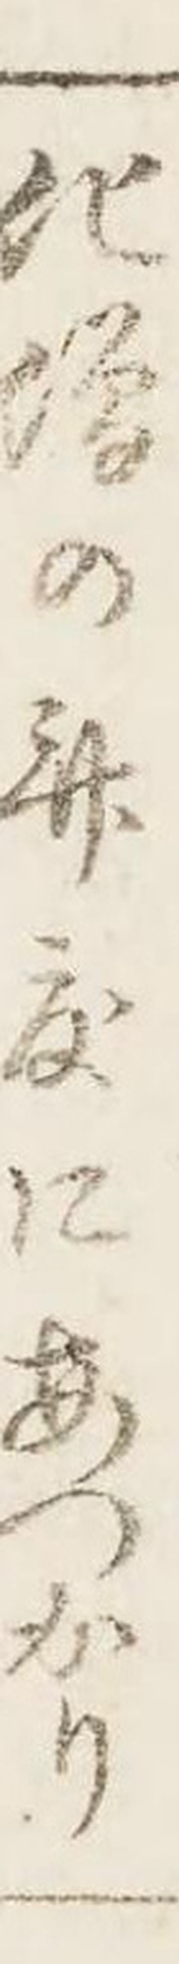化僧の済度にあつかり
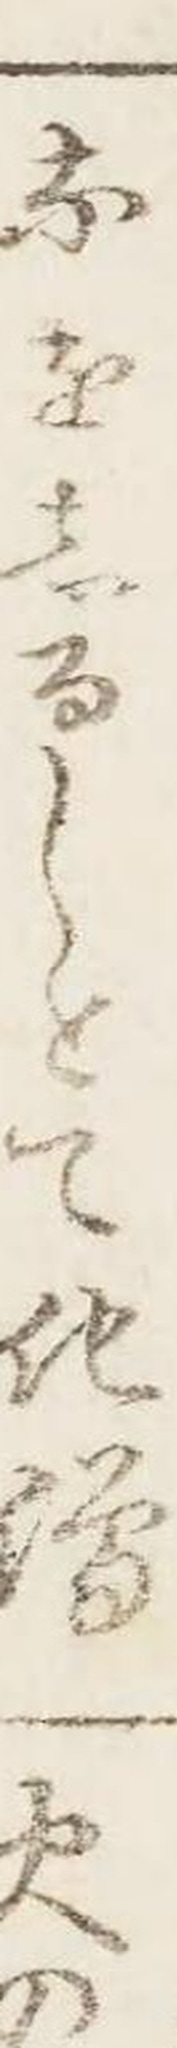なをしるしとて化僧
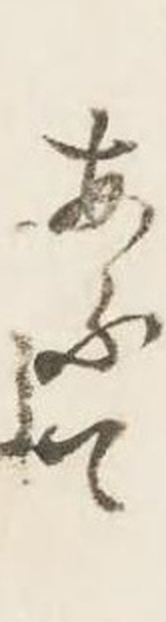あふて
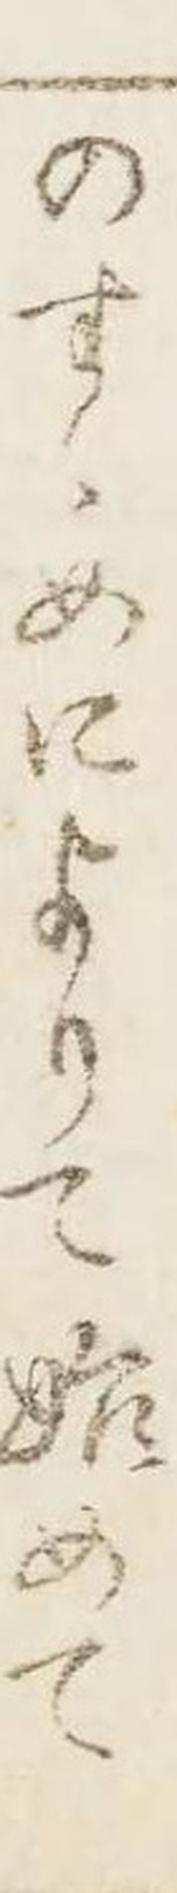のすゝめによりて始めて
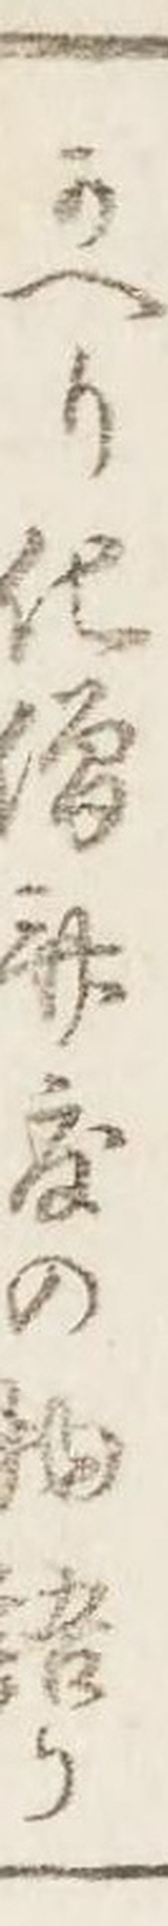かへり化僧済度の物語り
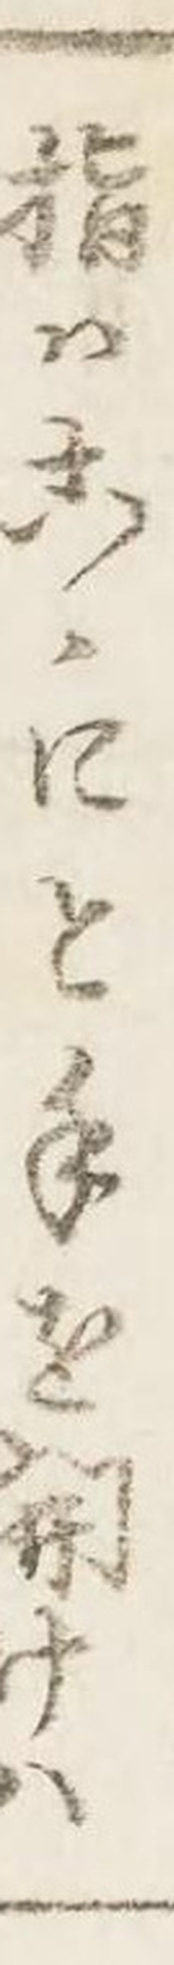指はこゝにと手を開けは
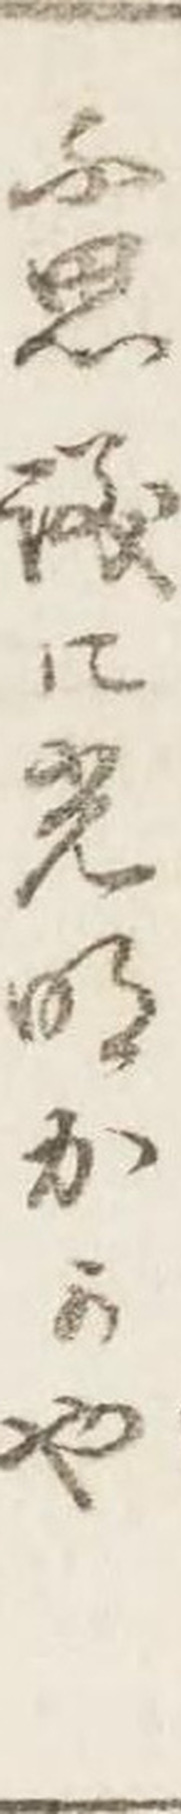ふ思議に光明かかや
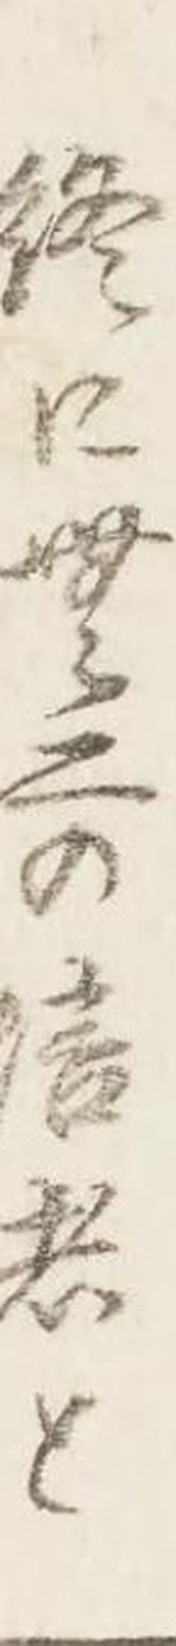終に無二の信者と
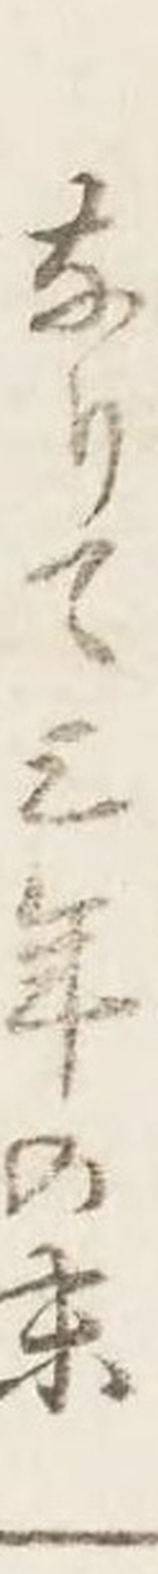なりて三年の末
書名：加能真宗聖集
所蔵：Ishikawa Prefectural Library
